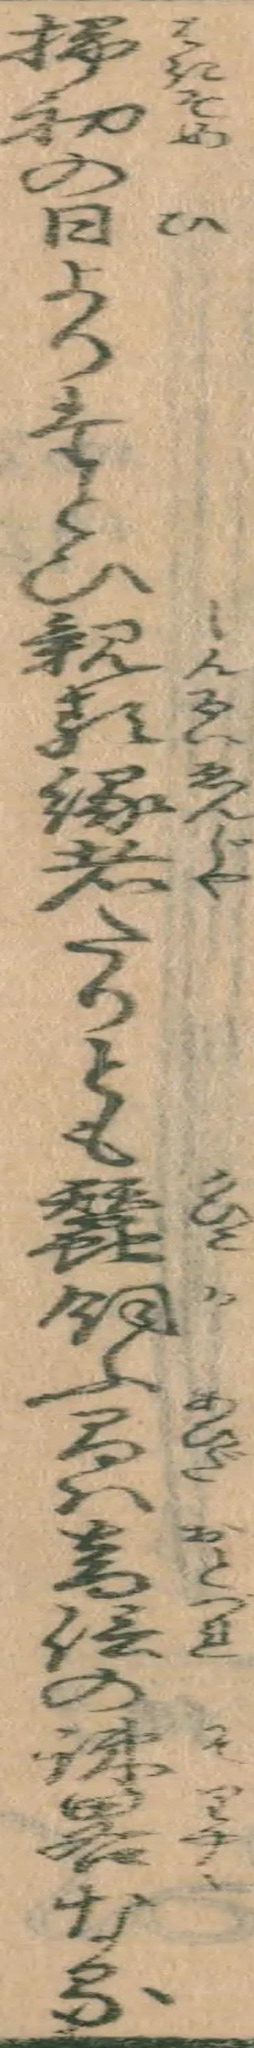掃初の日よりたとひ親類縁者たりとも蚕飼ふ間は音信の疎略なる
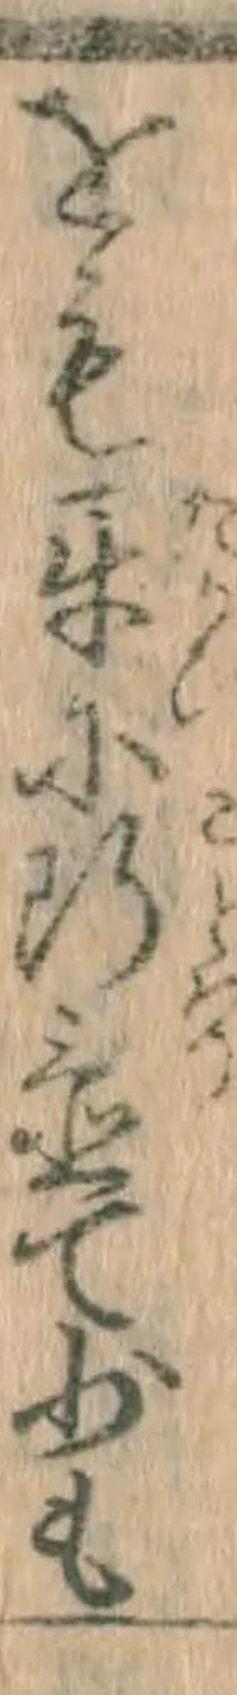をも互に断置て少も
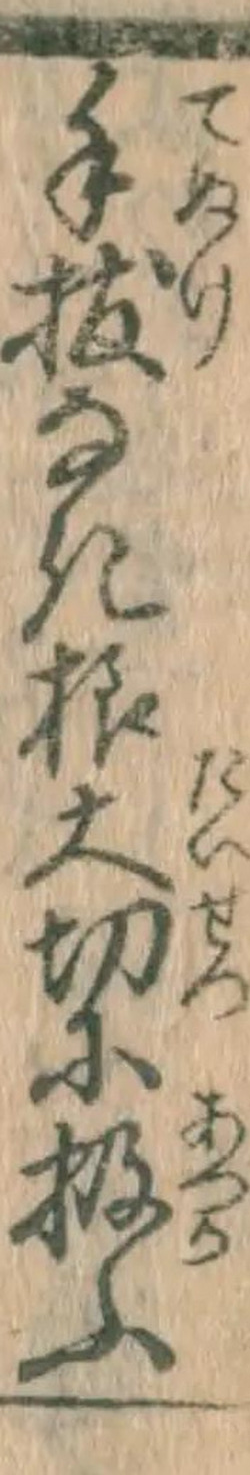手抜なき様大切に扱ふ
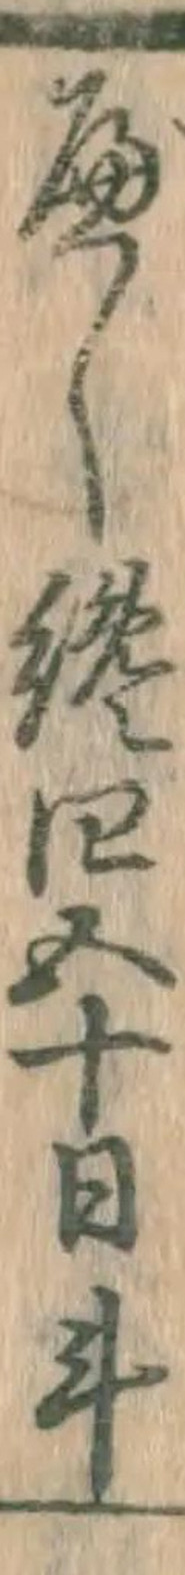べし纔四五十日斗
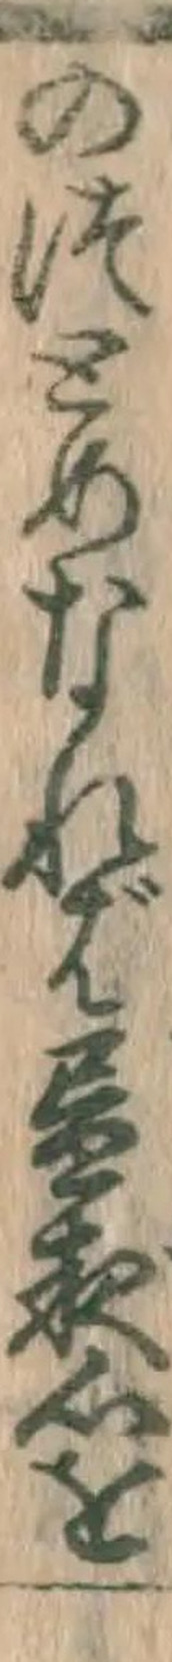のつとめなれば昼夜心を
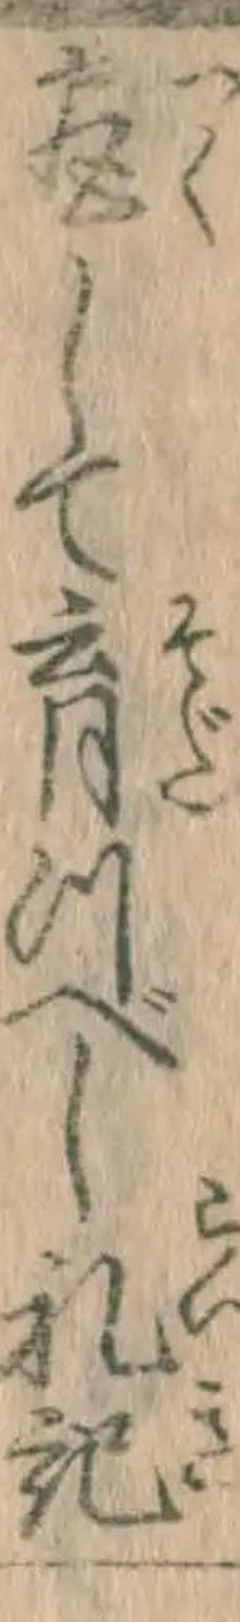尽して育つべし礼記
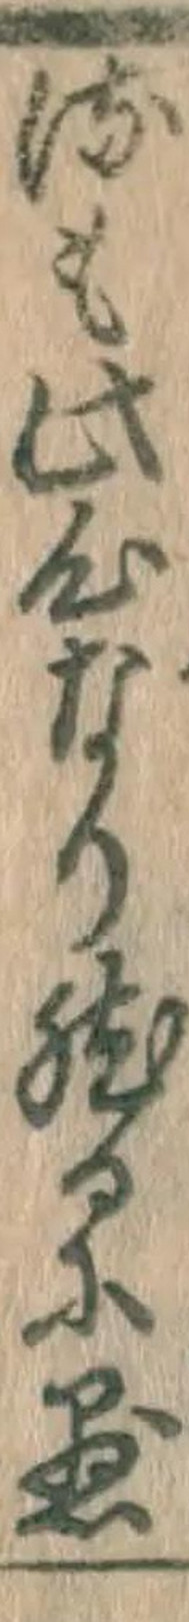るも此心なり然るに愚
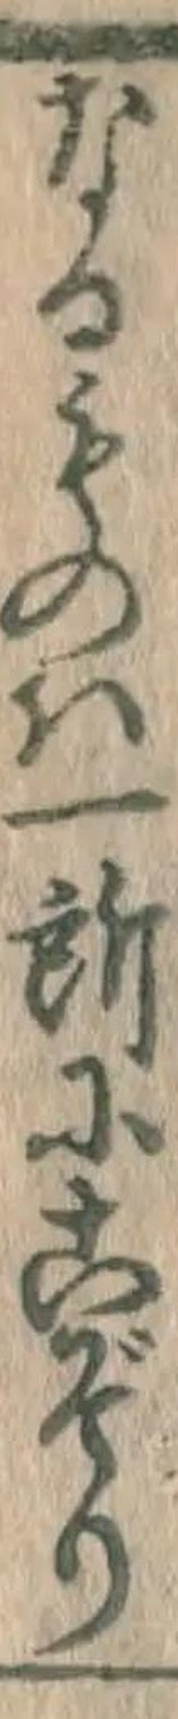なるものは一所にこぞり
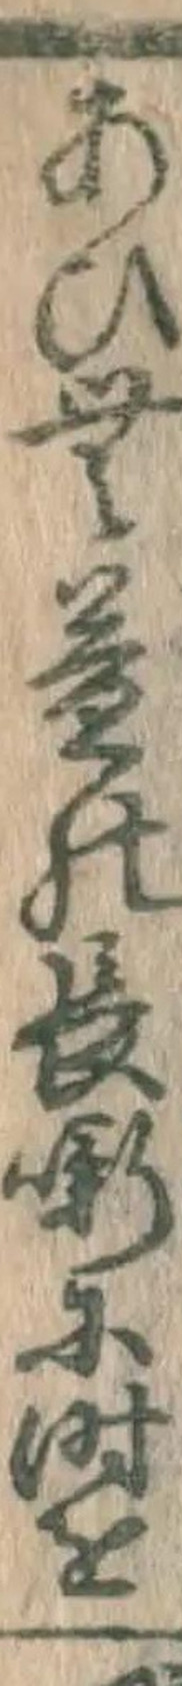あひ無益の長噺に時を
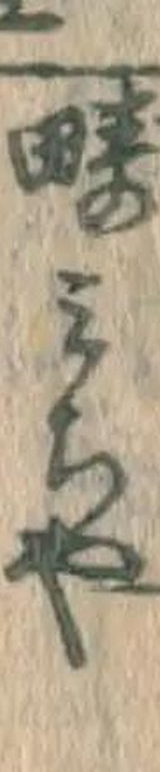畦みちや
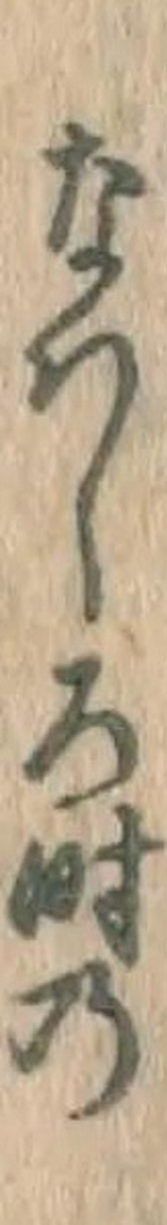なはしろ時の
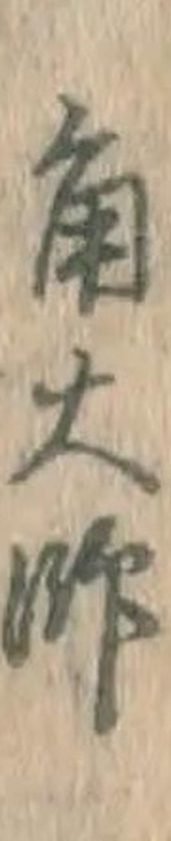角大師
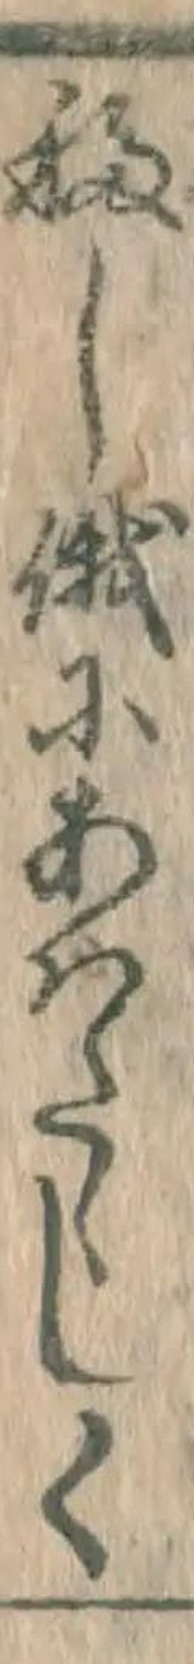移し俄にあはたゝしく

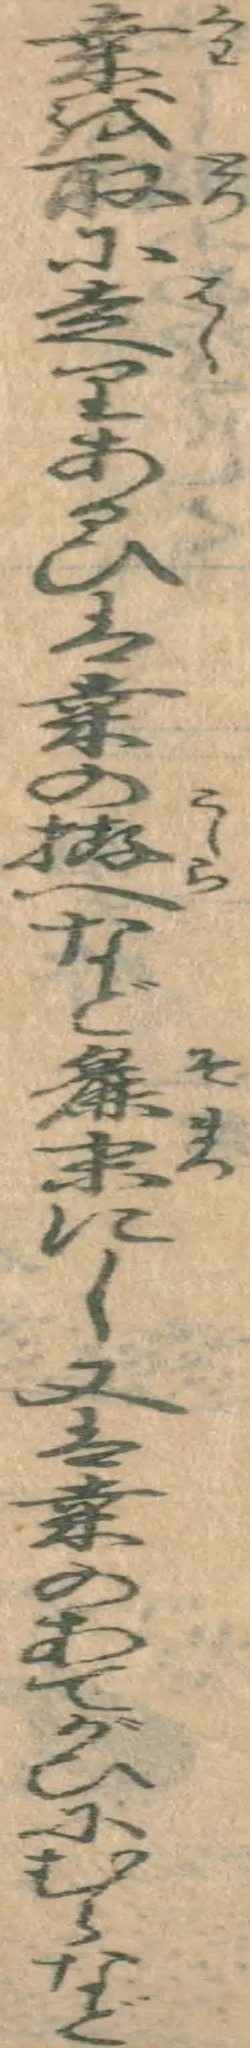桑を取に走りあるひは桑の拵へなど麁末にし又は桑のあてがひにむらなど
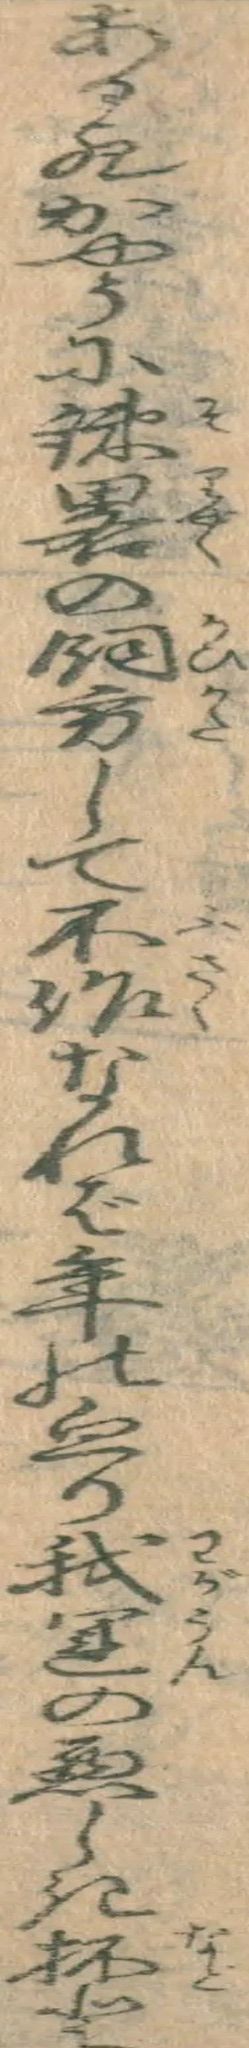ある歟かやうに疎略の飼方して不作なれば年の廻り我運の悪しき抔と
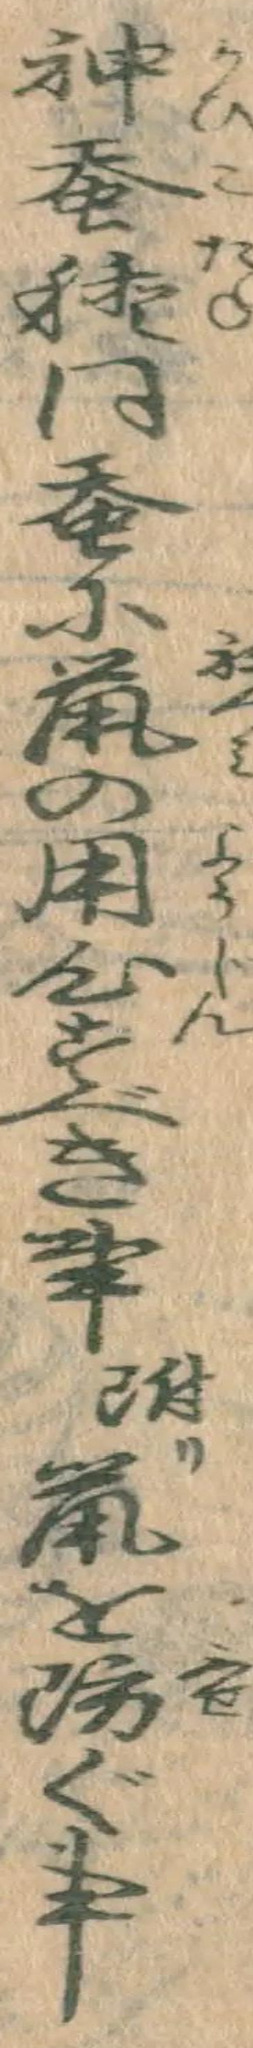神蚕種同蚕に鼠の用心すべき事附り鼠を防ぐ事
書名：養蚕秘録 3巻. [1]
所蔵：国立国会図書館 National Diet Library, JAPAN
